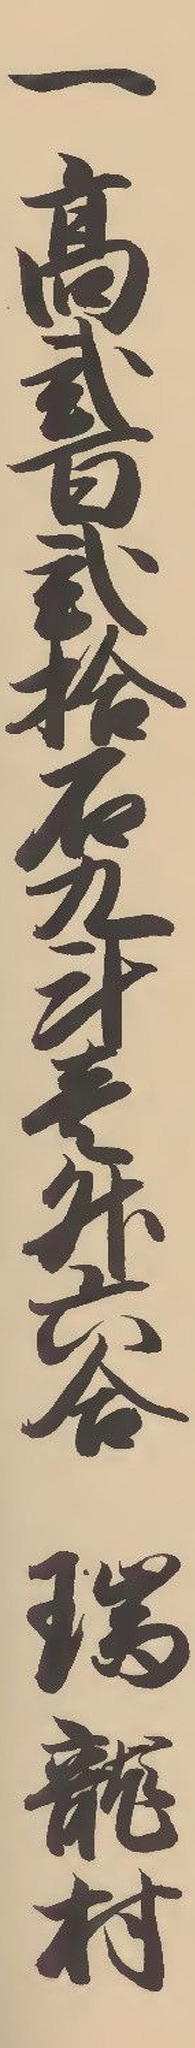一高弐百弐拾石九斗壱升六合瑞竜村
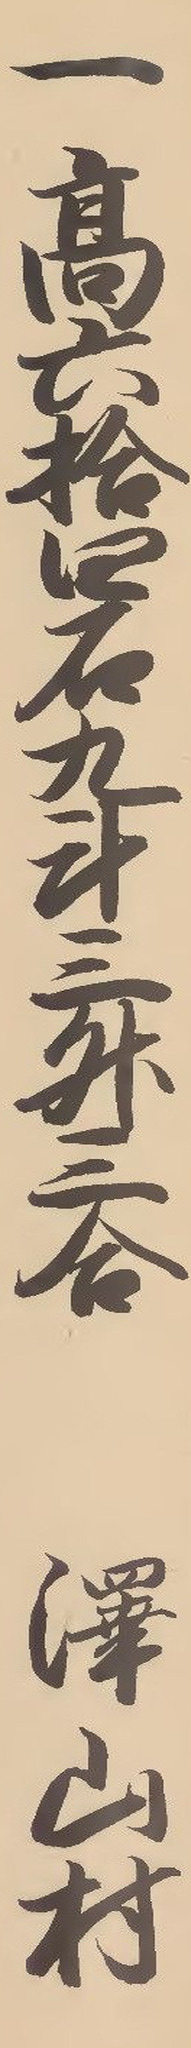一高六拾四石九斗三升三合沢山村
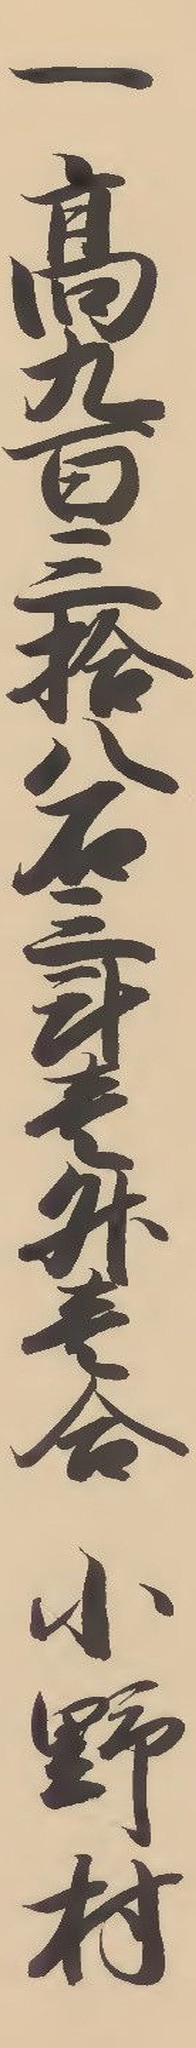一高九百三拾八石三斗壱升壱合小野村
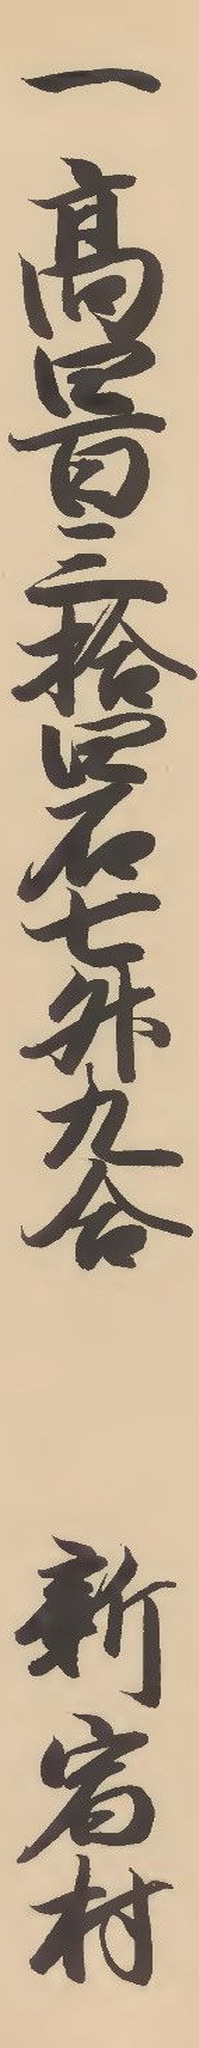一高四百三拾四石七升九合新宿村
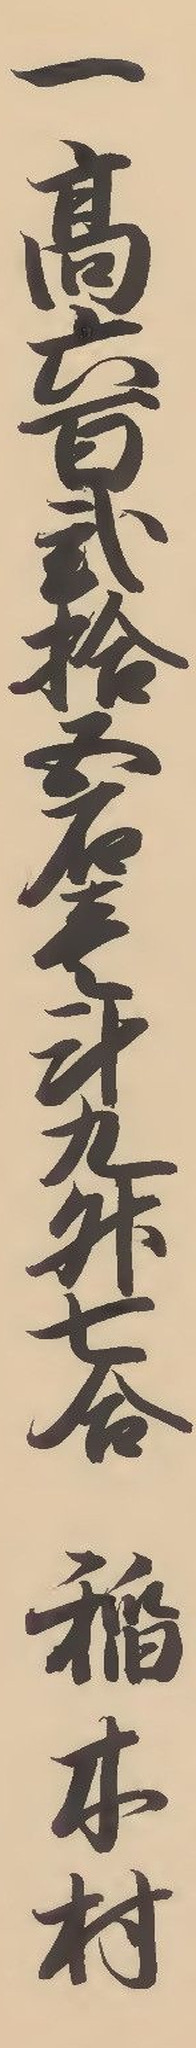一高六百弐拾五石壱斗九升七合稲木村

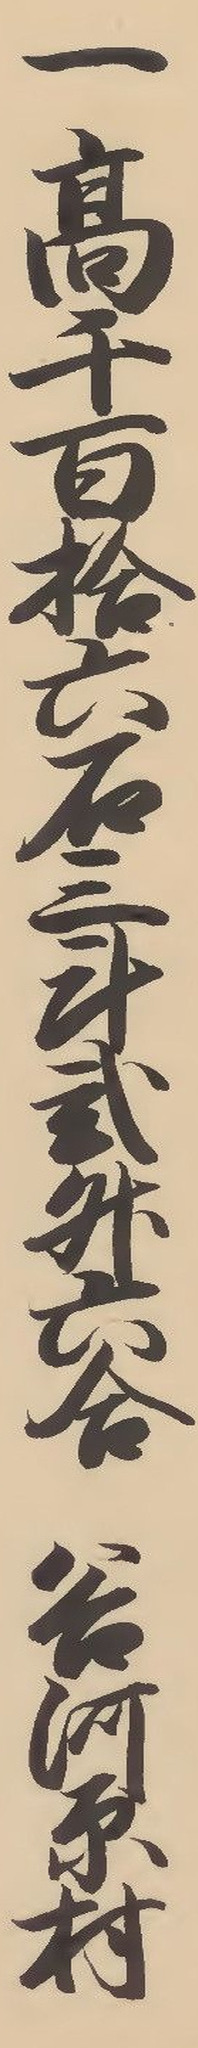一高千百拾六石三斗弐升六合谷河原村
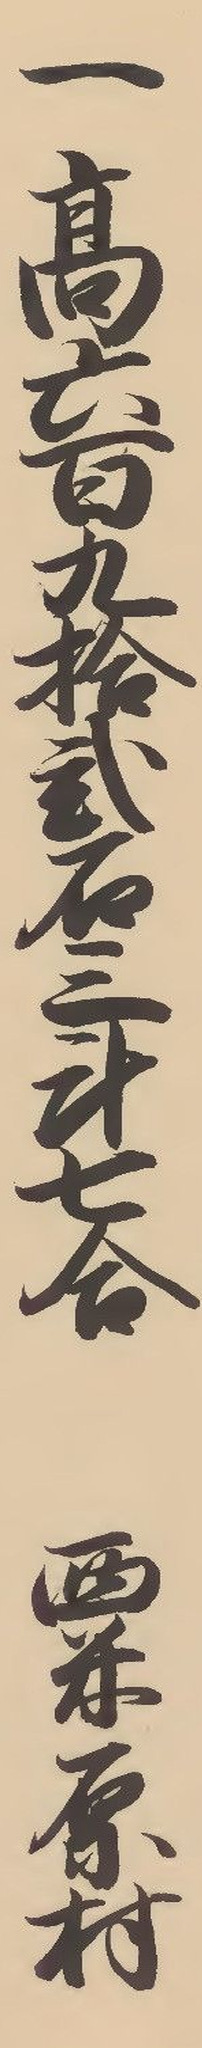一高六百九拾弐石三斗七合粟原村
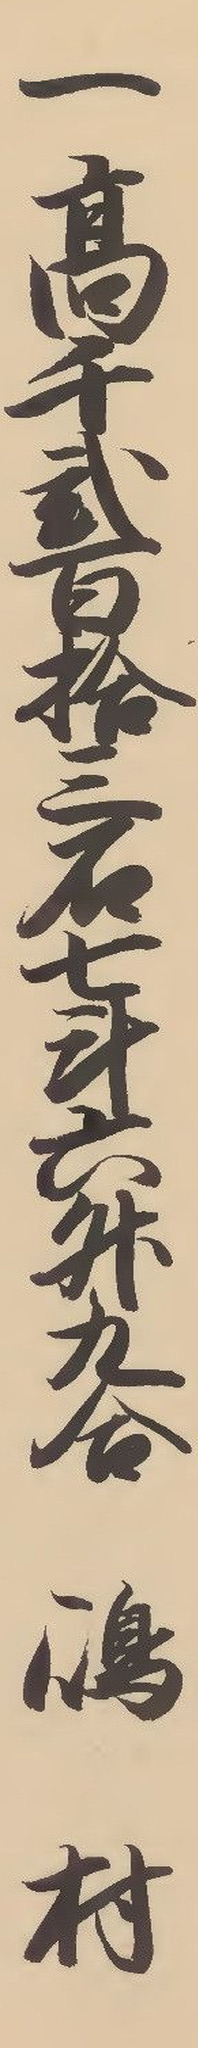一高千弐百拾三石七斗六升九合島村
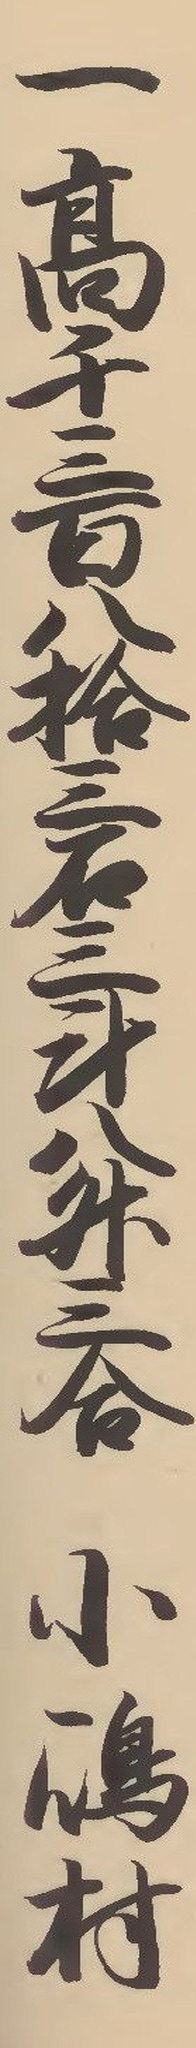一高千三百八拾三石三斗八升三合小島村
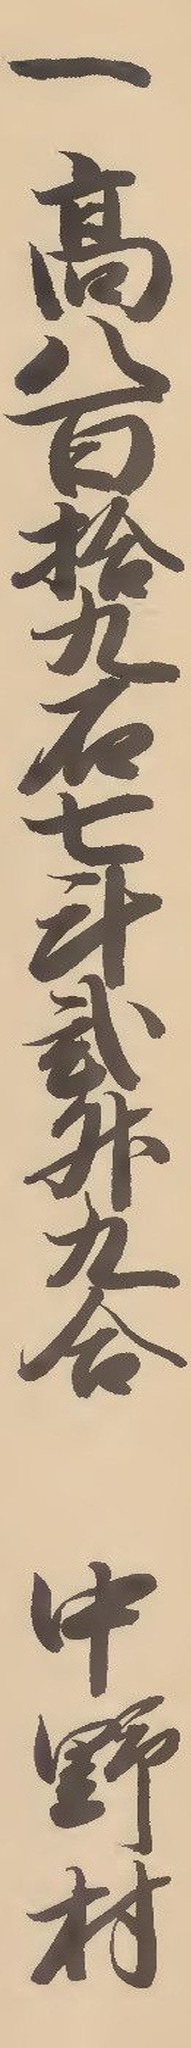一高八百拾九石七斗弐升九合中野村
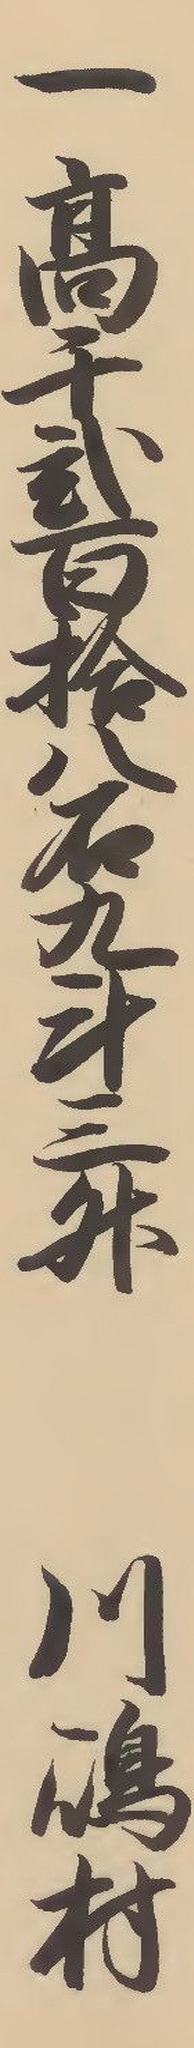一高千弐百拾八石九斗三升川島村
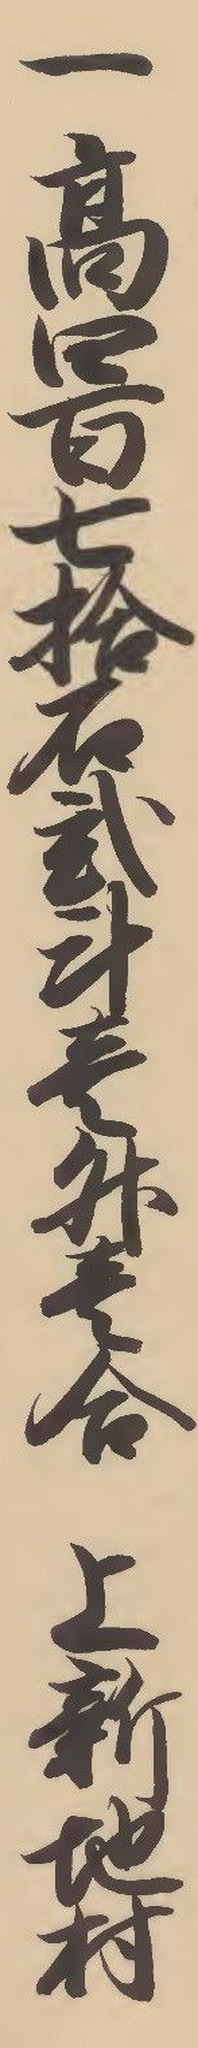一高四百七拾石弐斗壱升壱合上新地村
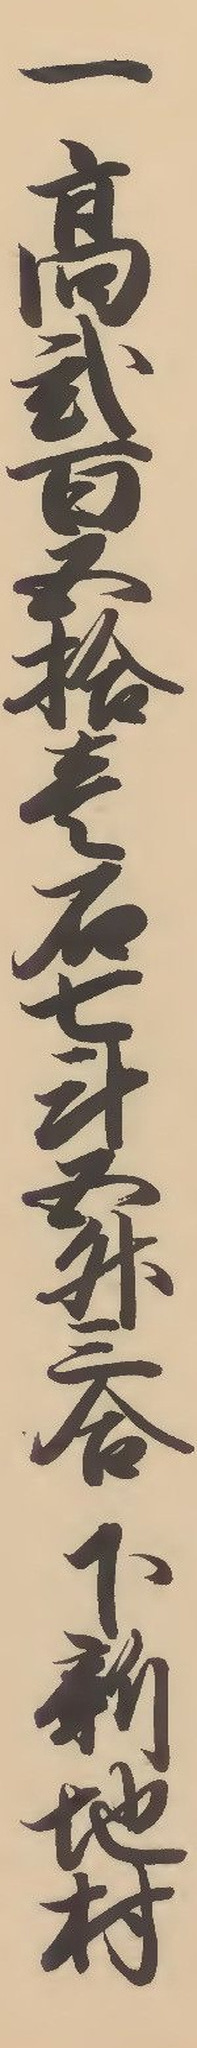一高弐百五拾壱石七斗五升三合下新地村

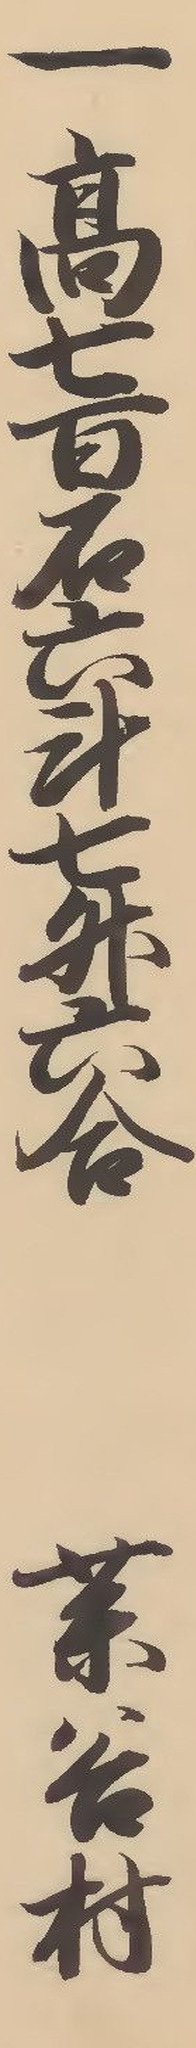一高七百石六斗七升六合薬谷村
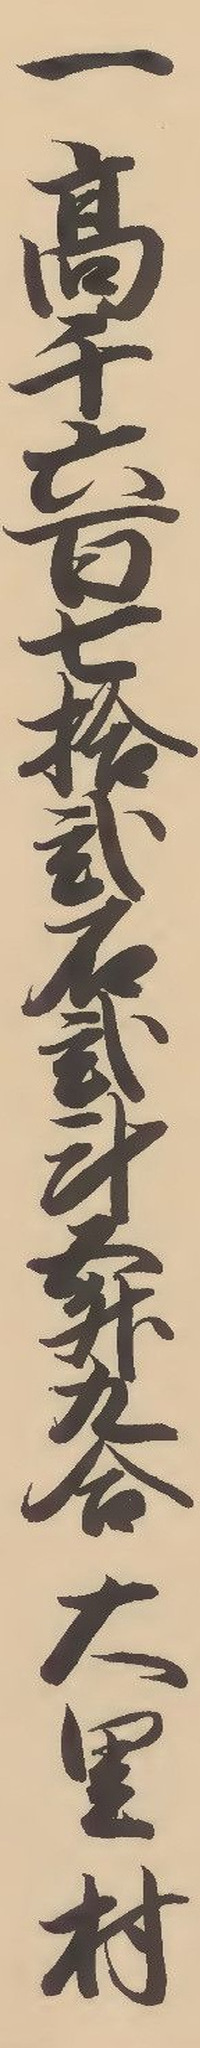一高千六百七拾弐石弐斗五升九合大里村
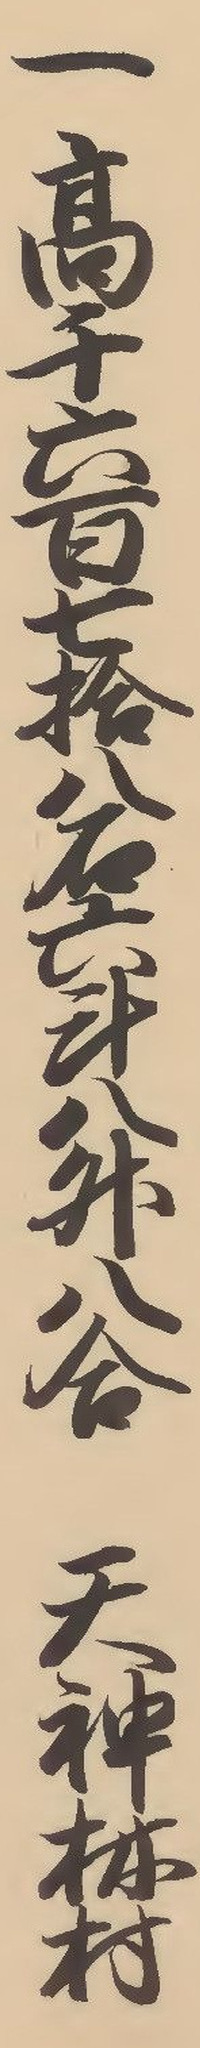一高千六百七拾八石六斗八升八合天神林村
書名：常陸国郷帳
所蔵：国立公文書館 National Archives of Japan
